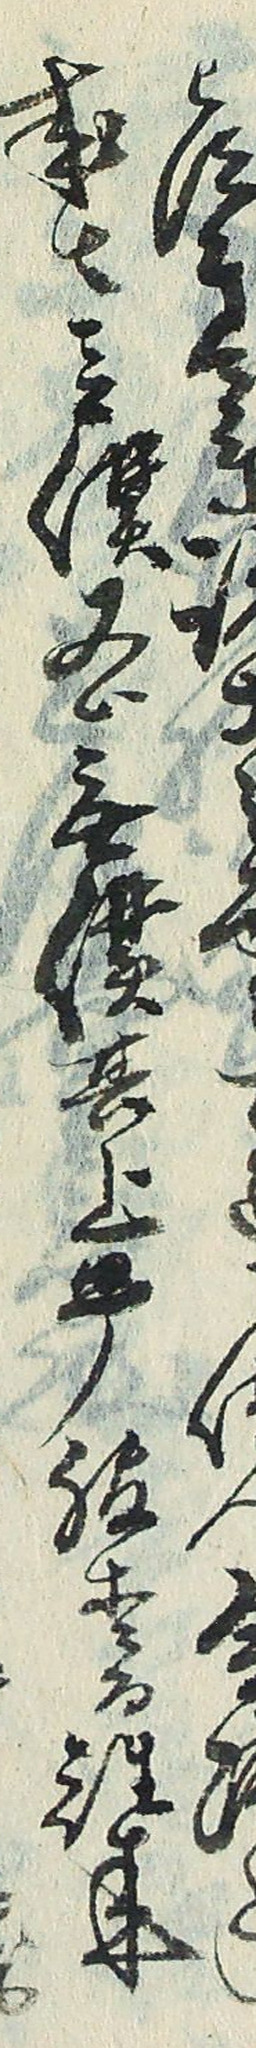或は壱僕又は無僕其上麁服等に而往来
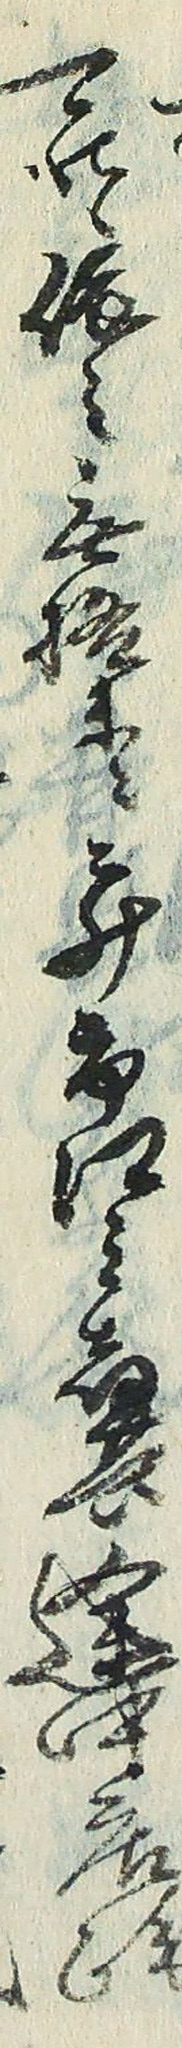可仕候依之無格末々幷市郷之者共途中店崎
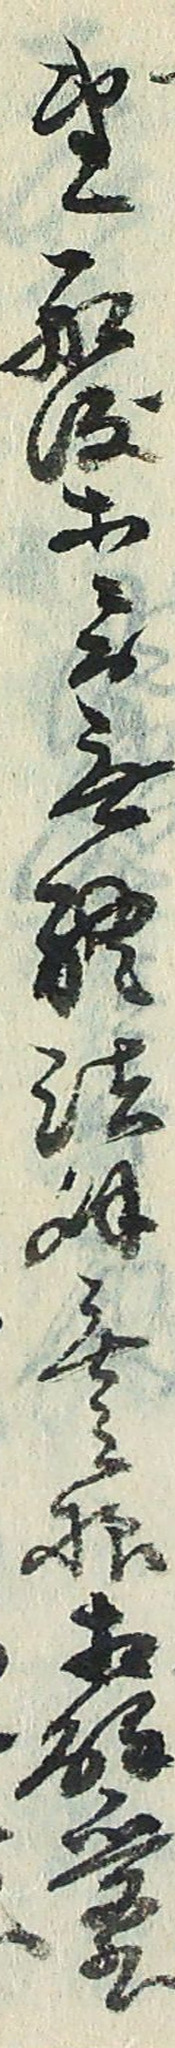第一船渡等に而無礼法外之義無之様相触受書
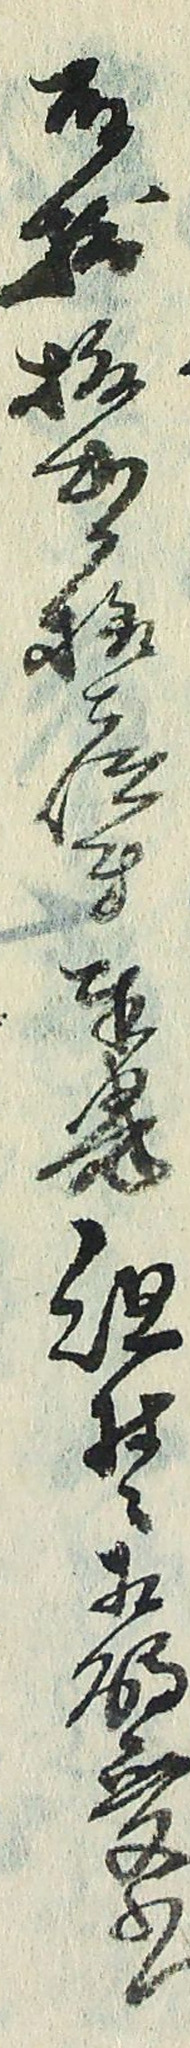取揃指出候様被仰付奉畏組村々相触受書
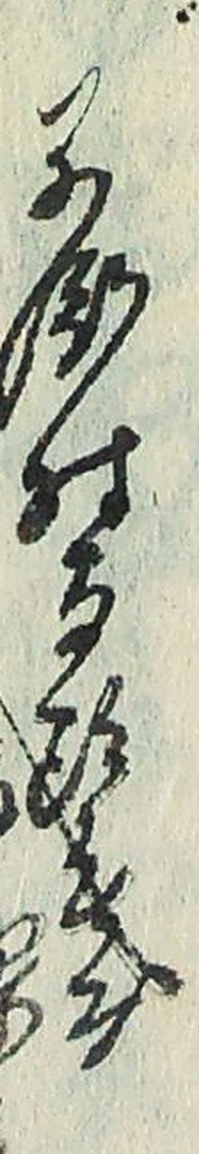早淵村与頭庄屋
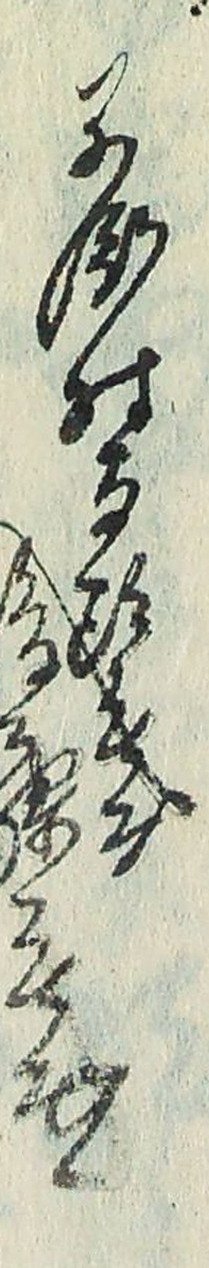早淵村与頭庄屋
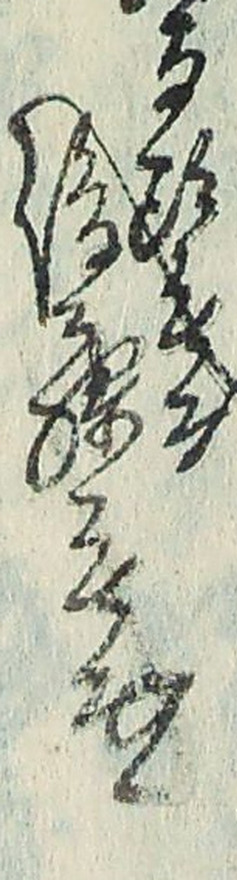後藤庄助
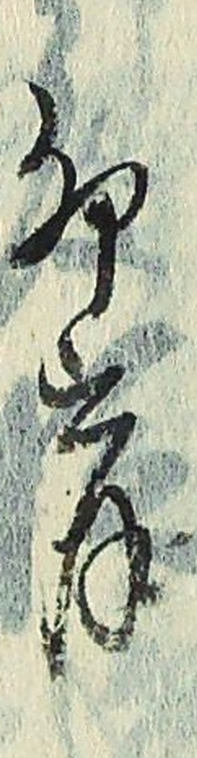卯六月
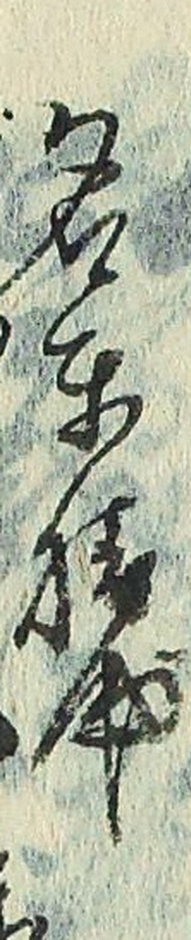名東勝浦
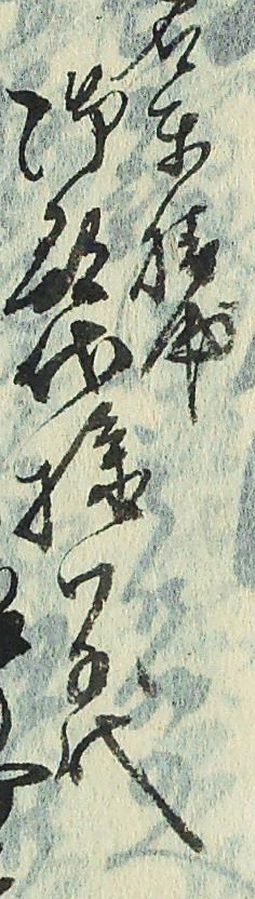御郡代様御手代
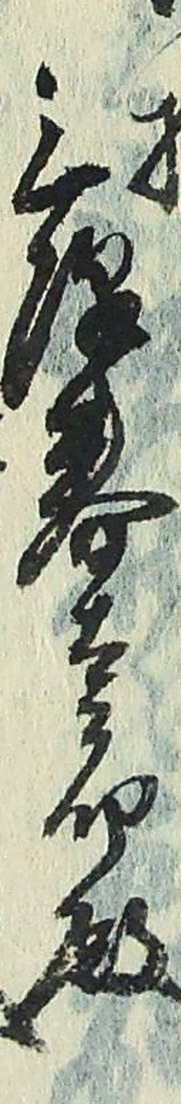三沢春太郎殿
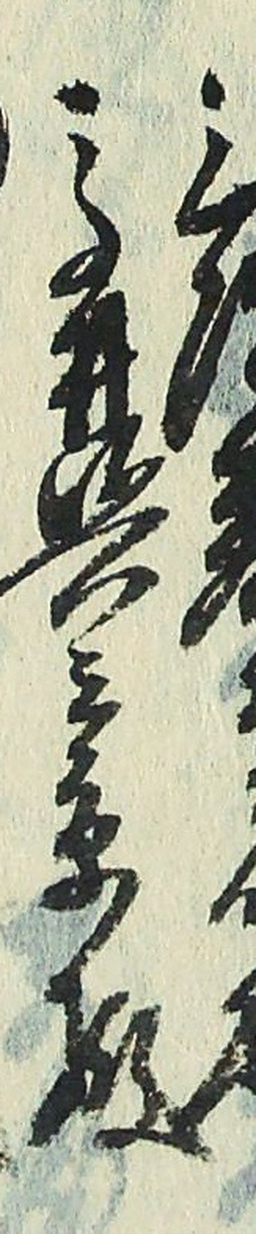高井与三兵衛殿
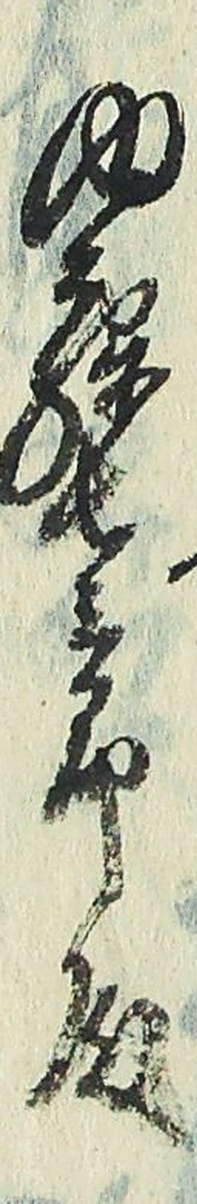内藤長三郎殿
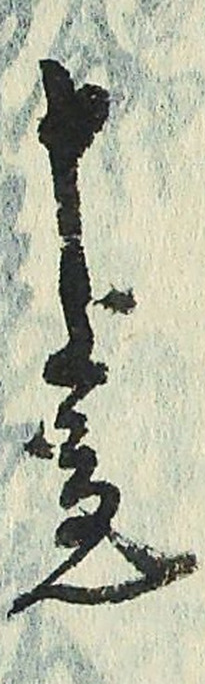申上覚
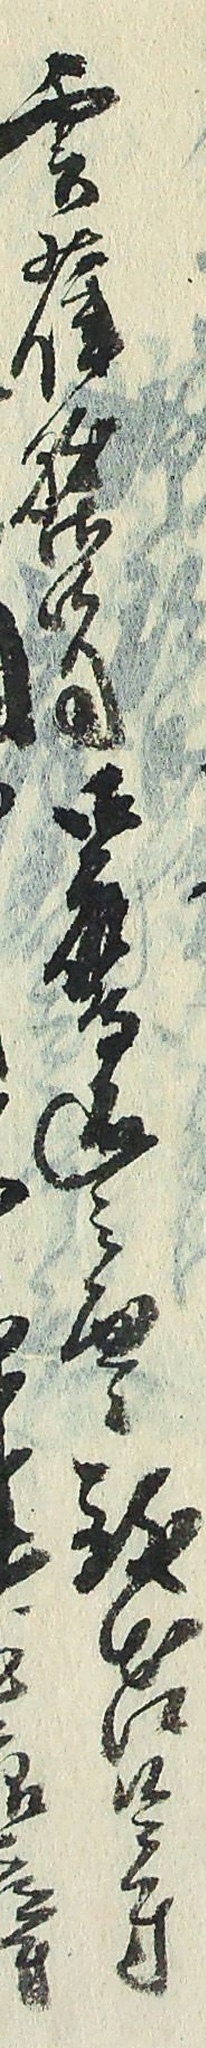雲雀就御仕用御鷹匠之面々致出郷候に付
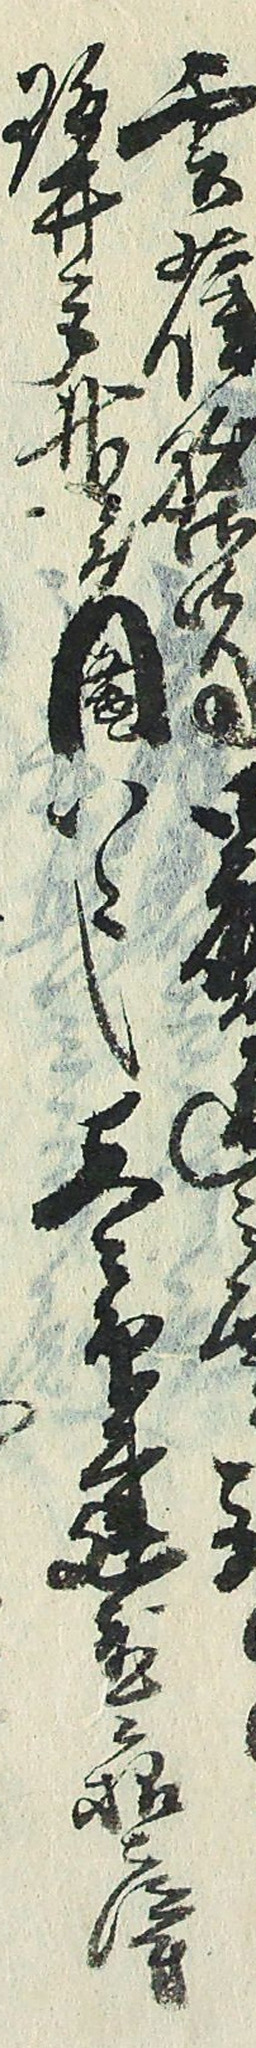野井戸竹に而囲いたし夫々印建置候様被仰付
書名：諸御用御□受書控
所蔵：鳴門教育大学 Naruto University of Education
